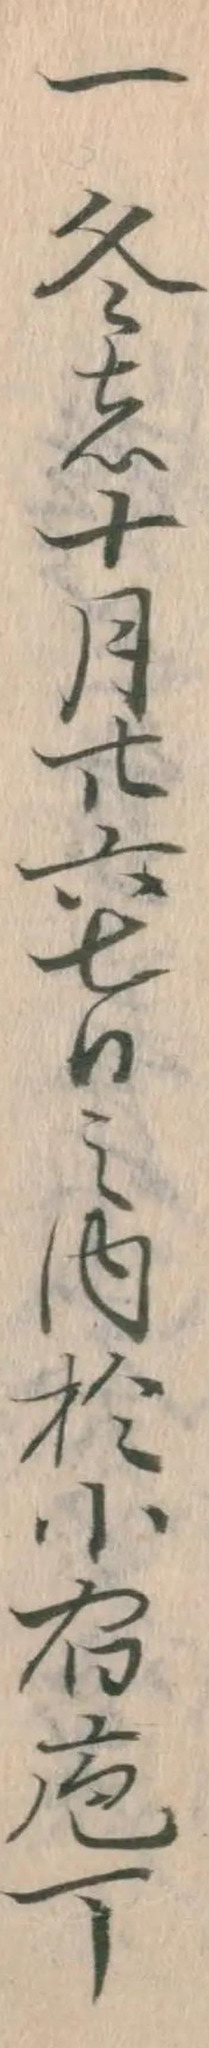一冬は十月廿六七日之内於小宿庖丁
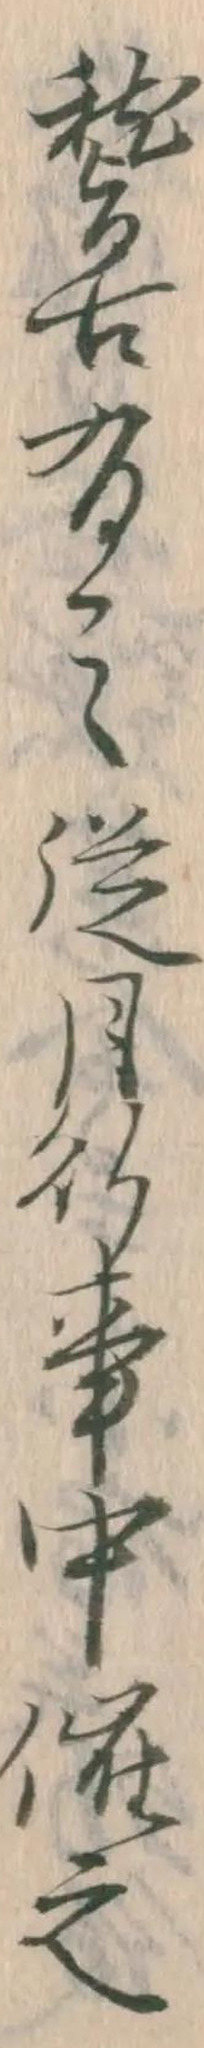稽古有之従月行事中催之
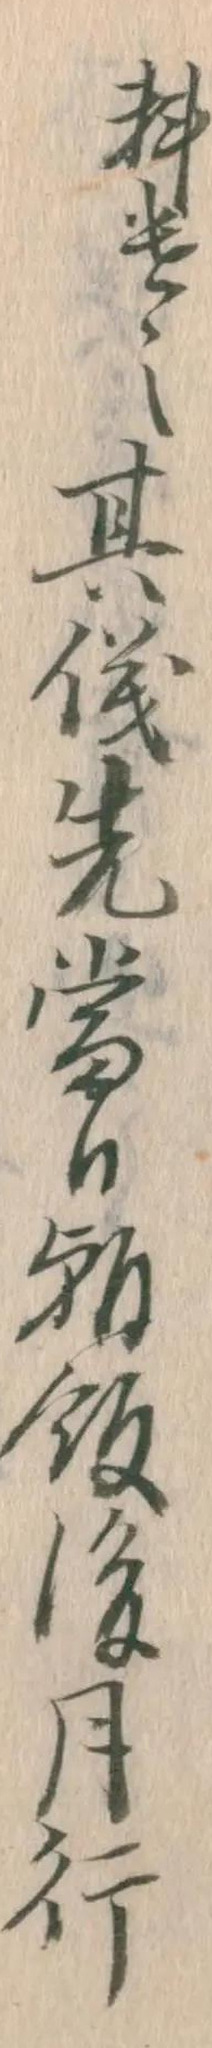料遣之其儀先当日朝飯後月行
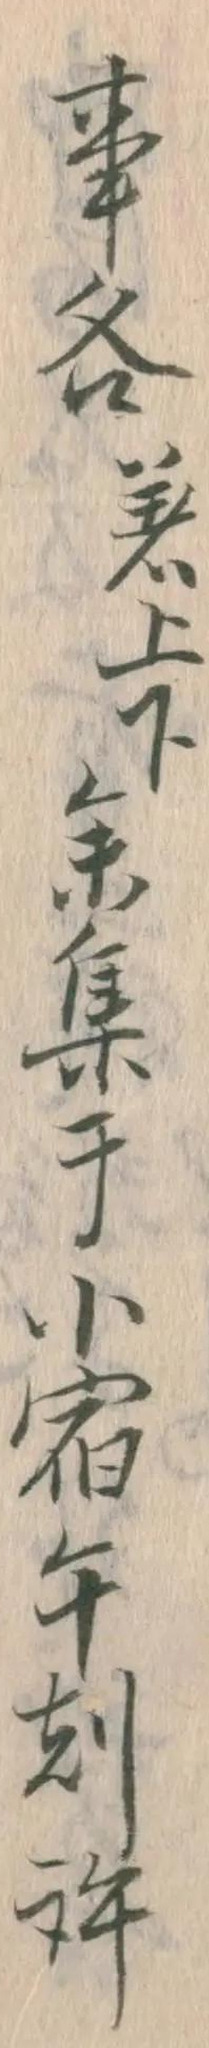事各着上下参集于小宿午刻許
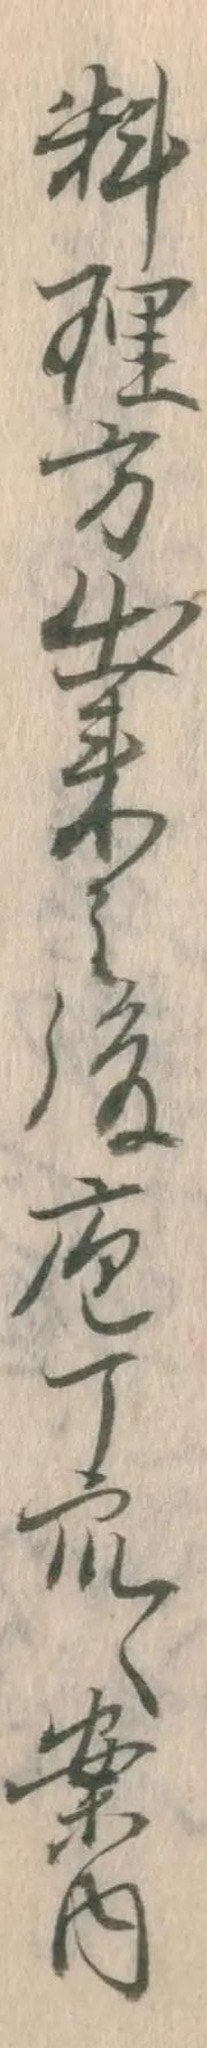料理方出来之後包丁衆へ案内
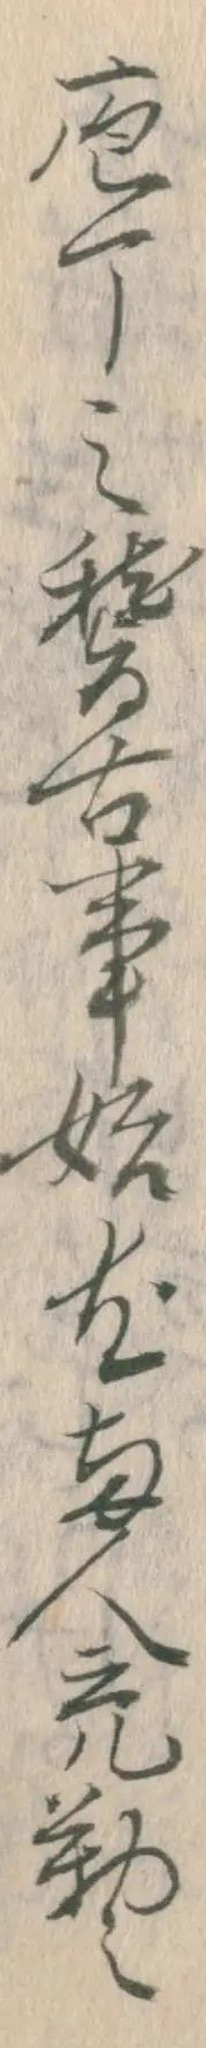包丁之稽古事始尤両人充勤之
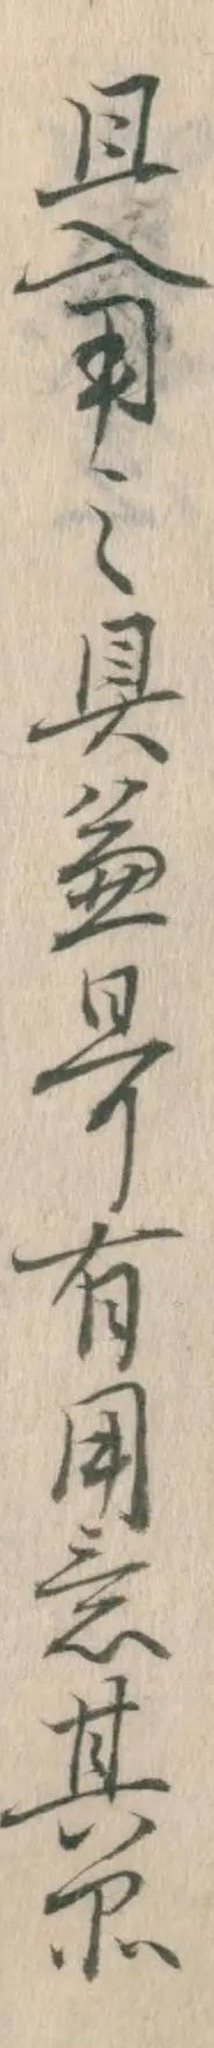且入用之具兼日可有用意其品

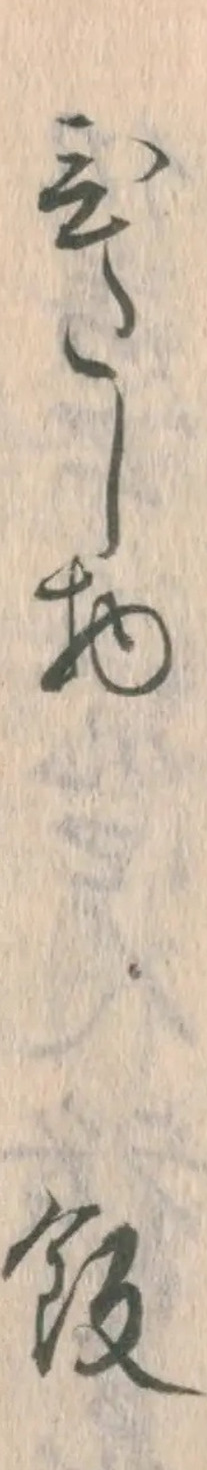ひたし物飯
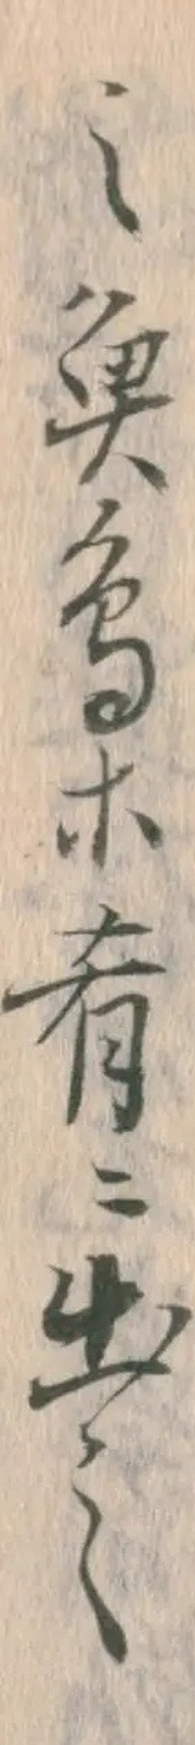之魚鳥等肴に出之
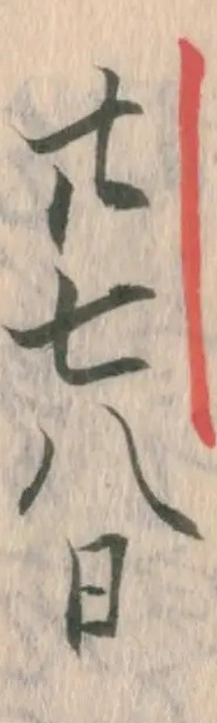廿七八日
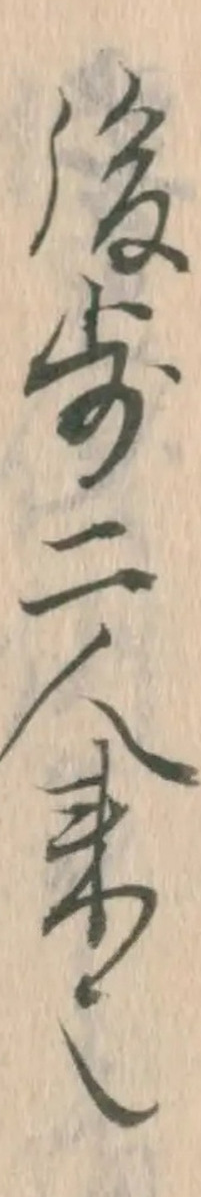後歩二人来也
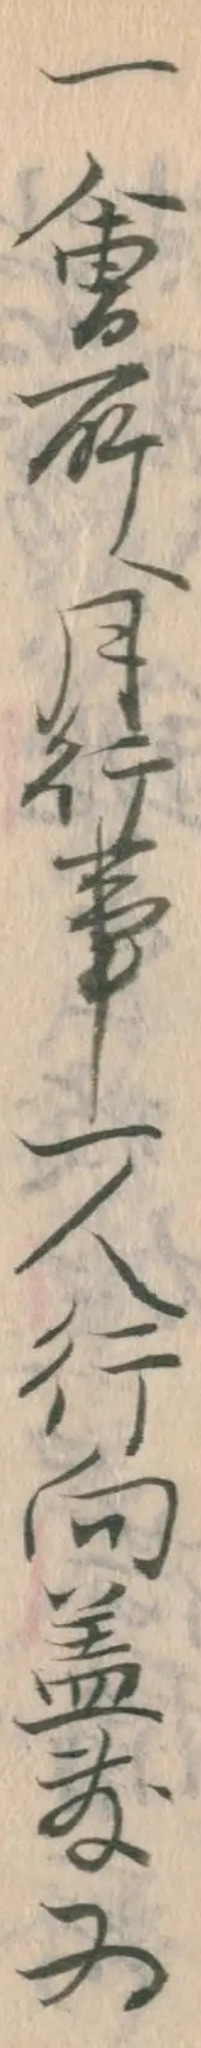一会所へ月行事一人行向蓋敷為
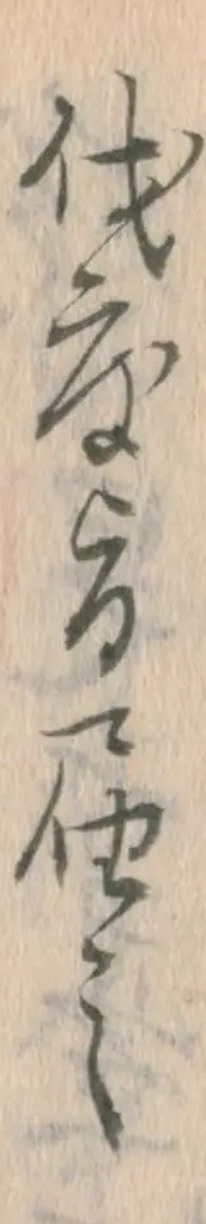伐度旨届之
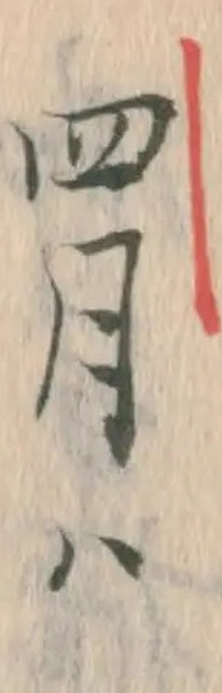四月は
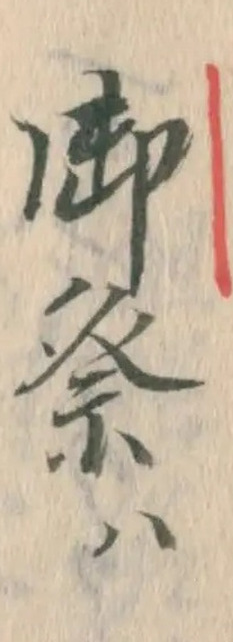御祭は
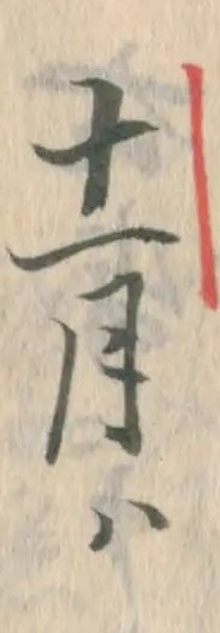十一月は
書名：賀茂社記録. 第81冊
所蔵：国立国会図書館 National Diet Library, JAPAN
